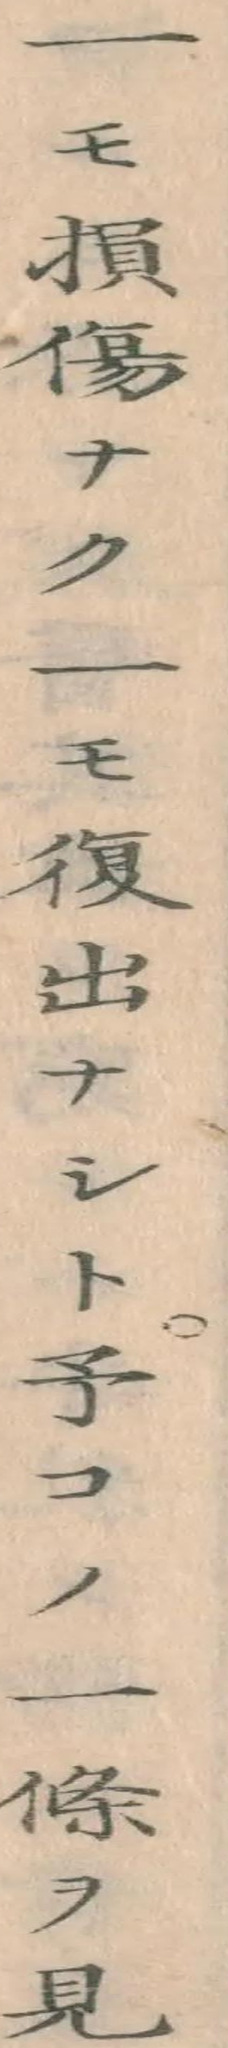一モ損傷ナク一モ復出ナシト。子コノ一条ヲ見
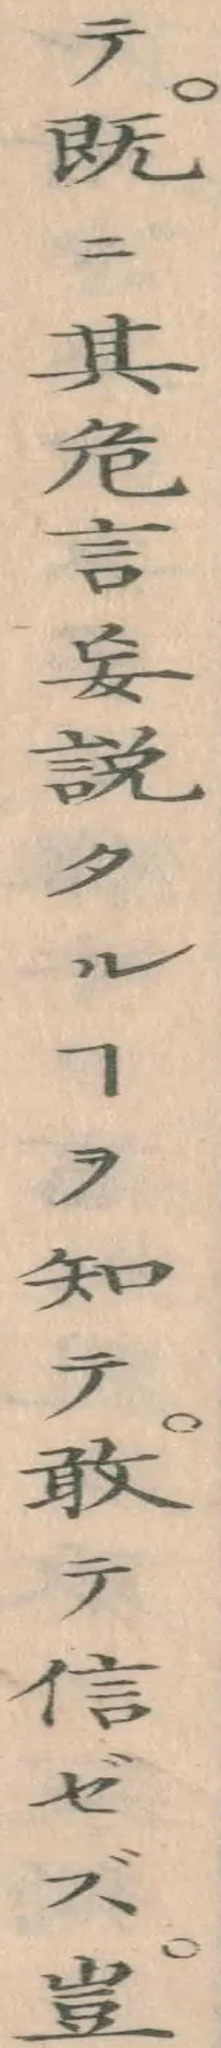テ。既ニ其危言妄説タルヿヲ知テ。敢テ信ゼズ。豈
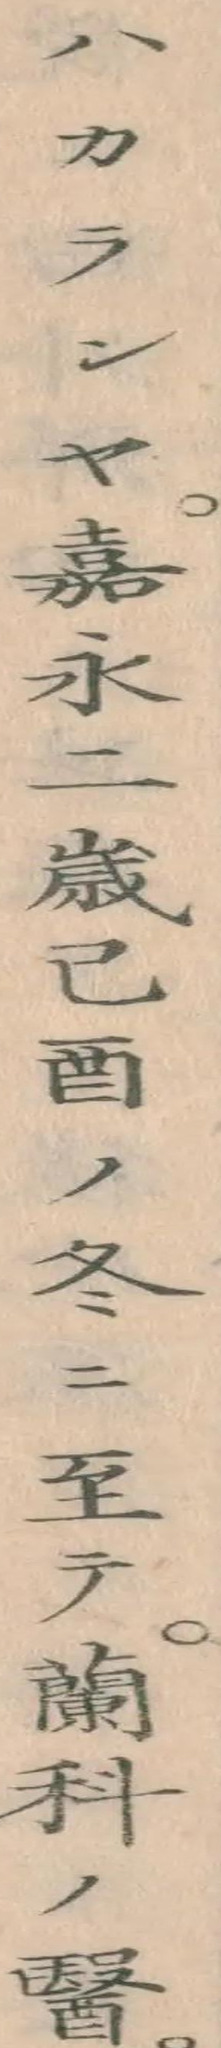ハカランヤ。嘉永二歳己酉ノ冬ニ至テ。蘭科ノ医。
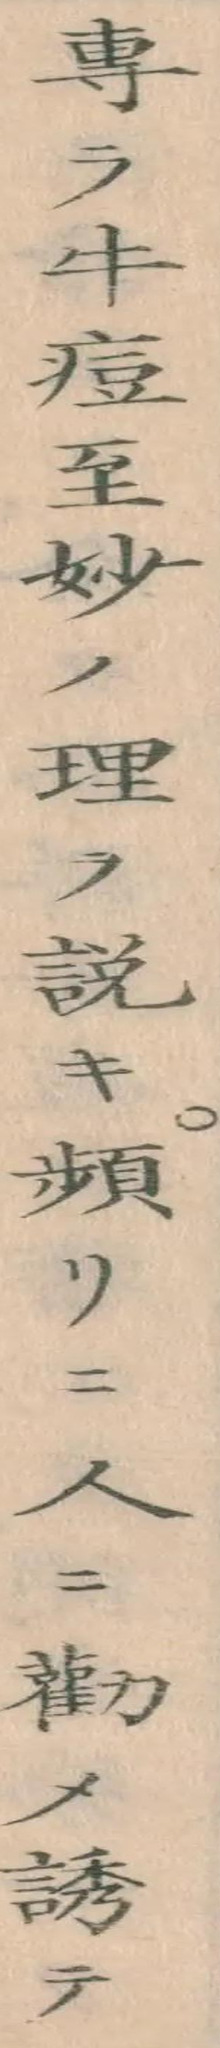専ラ牛痘至妙ノ理ヲ説キ。頻リニ人ニ勧メ誘テ
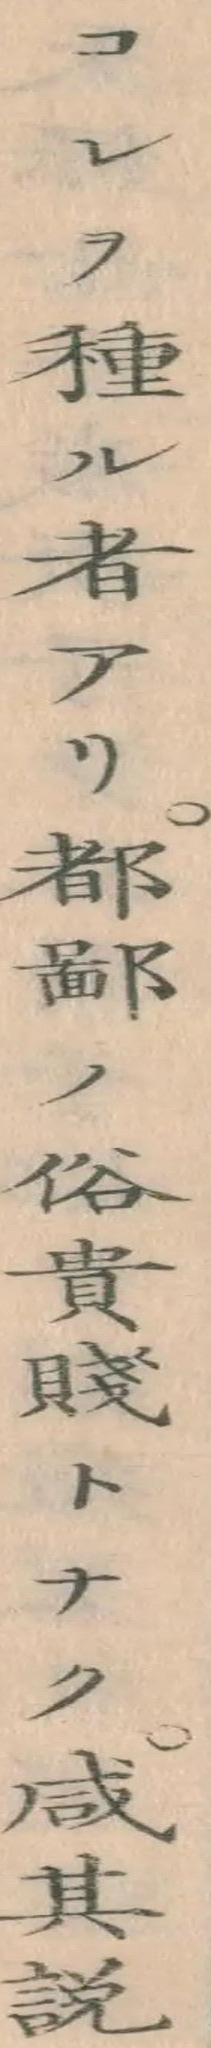コレヲ種ル者アリ。都鄙ノ俗貴賤トナク。咸其説
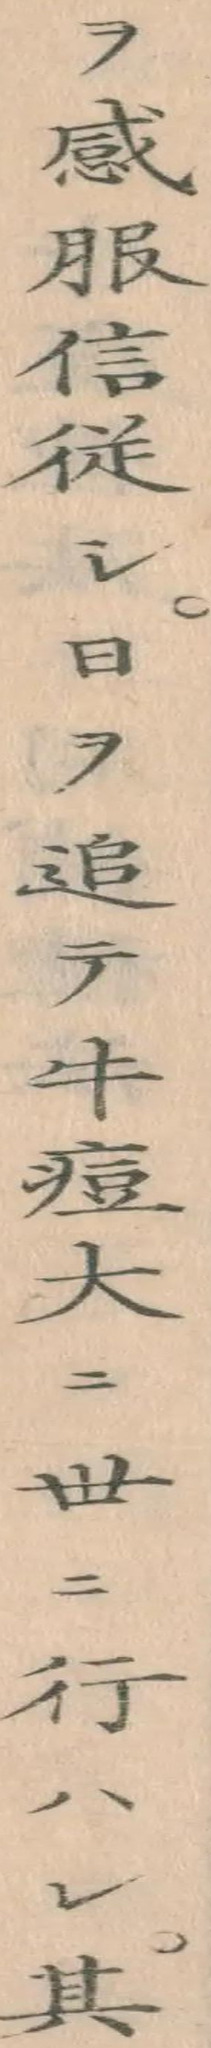ヲ感服信徒シ。日ヲ追テ牛痘大ニ世ニ行ハレ。其
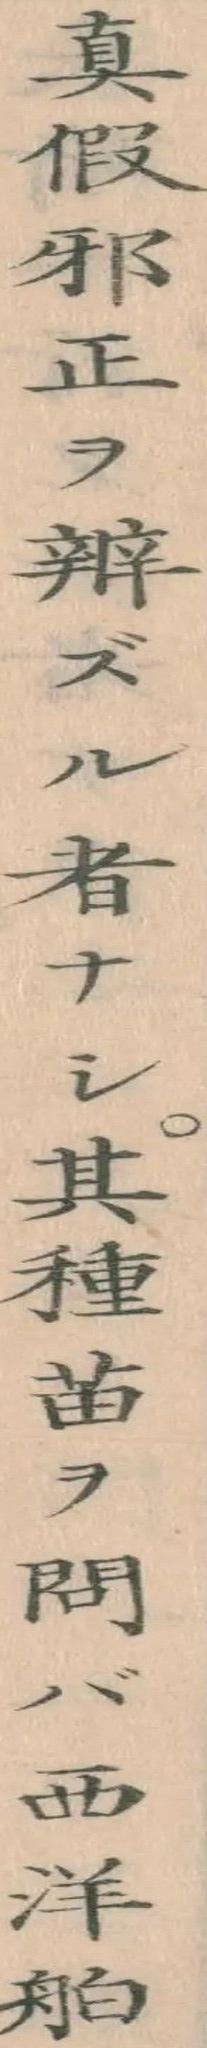真仮邪正ヲ弁ズル者ナシ。其種苗ヲ問バ西洋舶
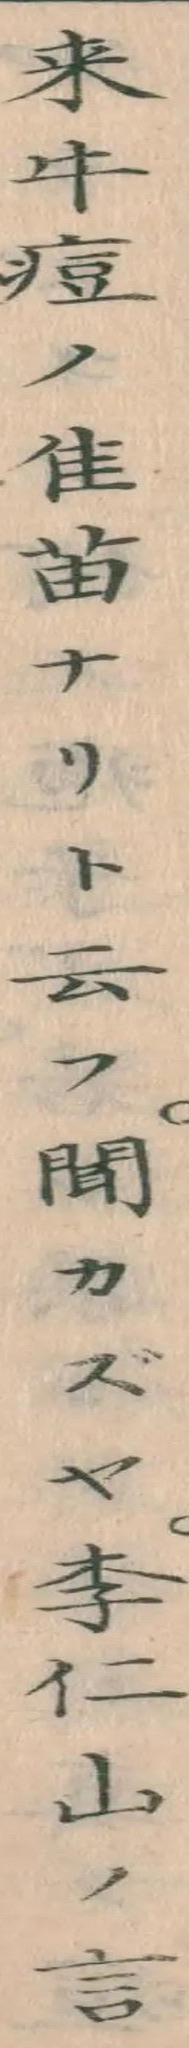来牛痘ノ隹苗ナリト云フ。聞カズヤ。李仁山ノ言
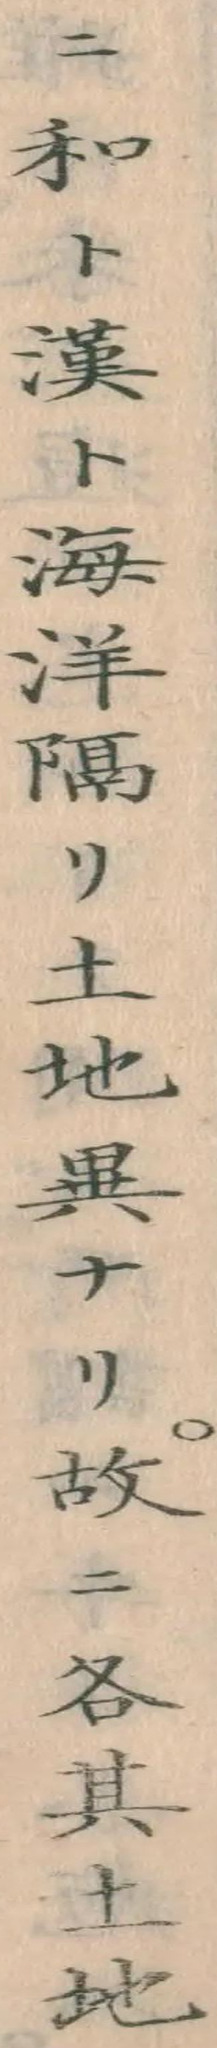ニ和ト漢ト海洋隔リ土地異ナリ。故ニ各其土地
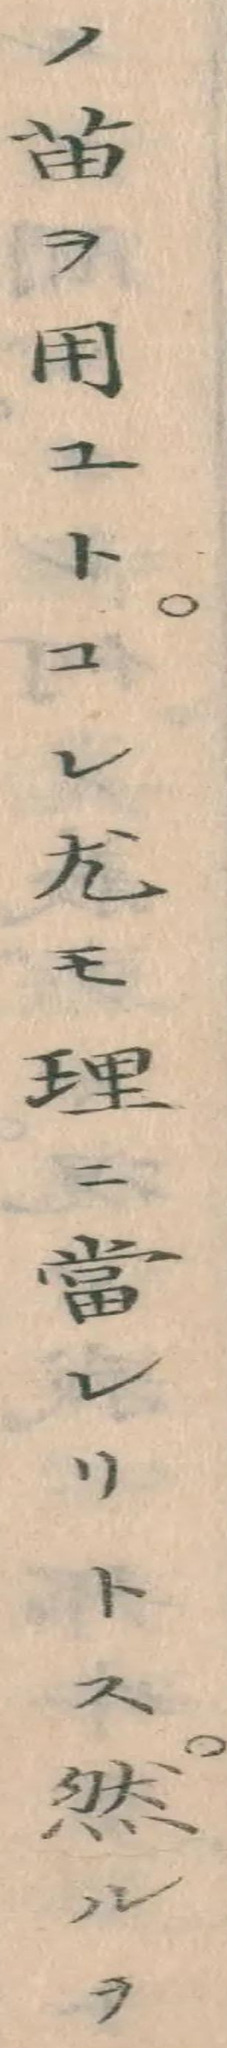ノ苗ヲ用ユト。コレ尤モ理ニ当レリトス。然ルヲ
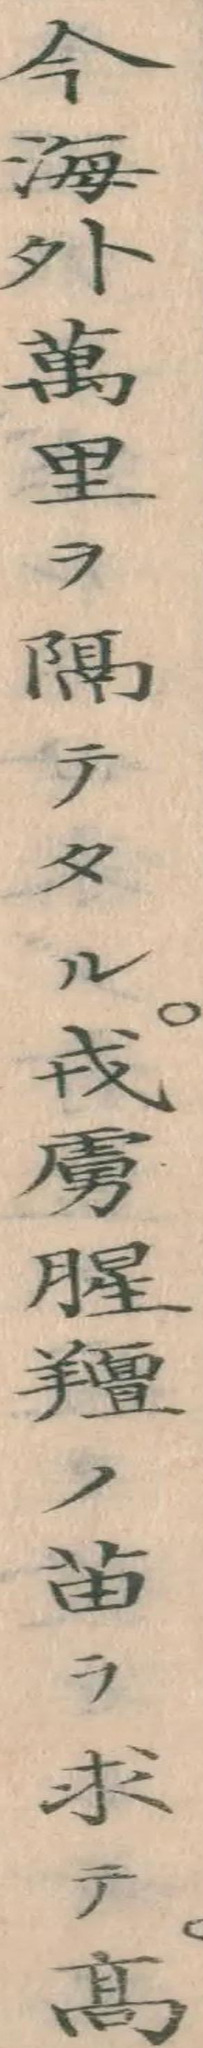今海外万里ヲ隔テタル。戎虜腥羶ノ苗ヲ求テ。高
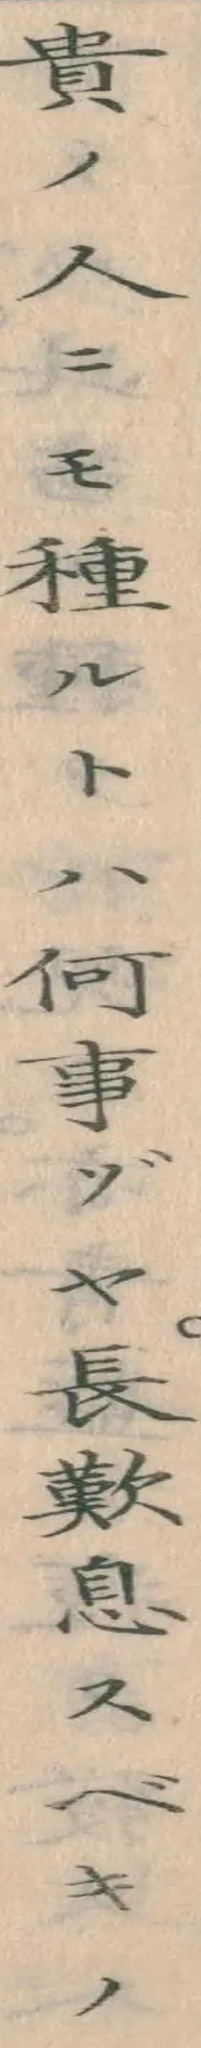貴ノ人ニモ種ルトハ何事ゾヤ。長歎息スベキノ
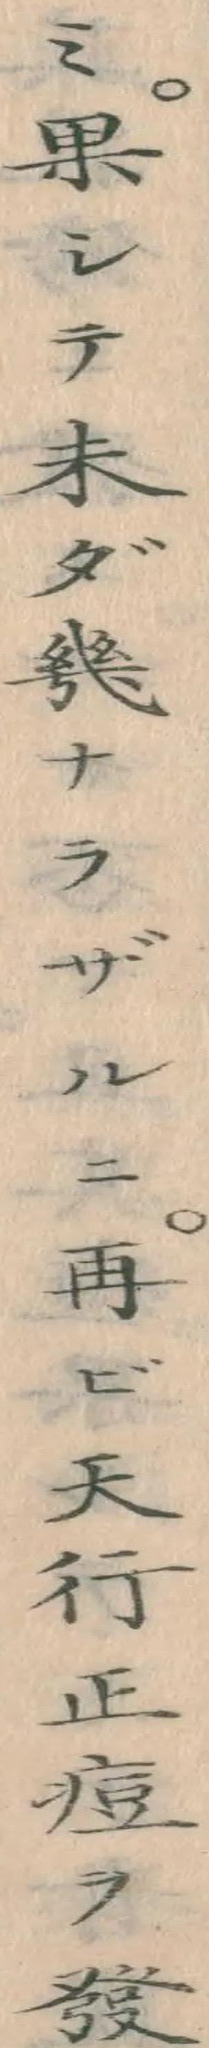ミ。果シテ未ダ幾ナラザルニ。再ビ天行正痘ヲ発
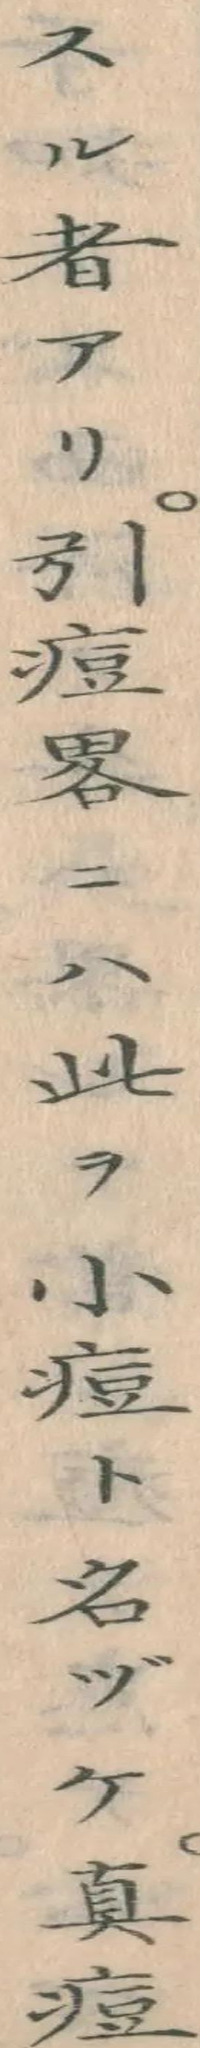スル者アリ。引痘略ニハ此ヲ小痘ト名ヅケ。真痘
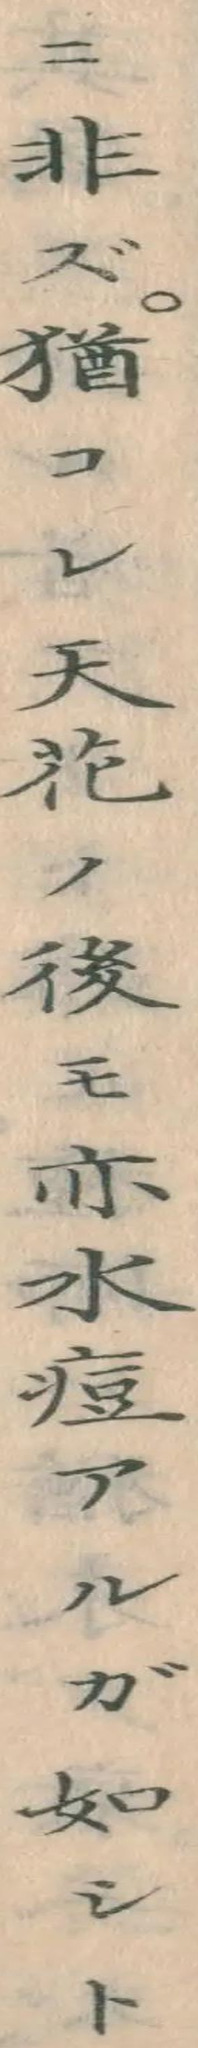ニ非ズ。猶コレ天花ノ後モ亦水痘アルガ如シト
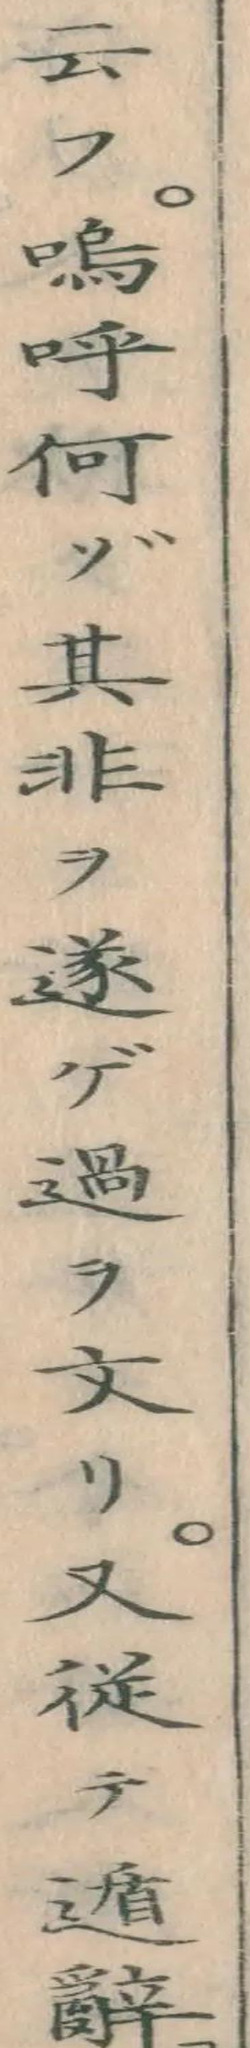云フ。嗚呼何ゾ其非ヲ遂ゲ過ヲ丈リ。又従テ遁辞
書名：種痘弁義
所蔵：国立国会図書館 National Diet Library, JAPAN
